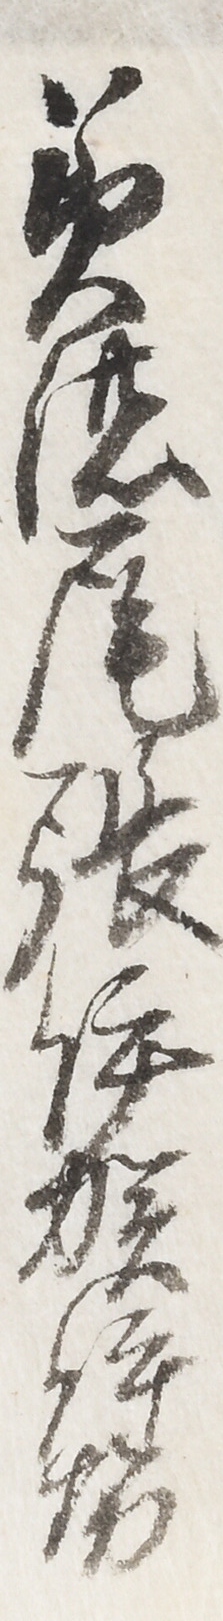美濃尾張伊賀伊勢
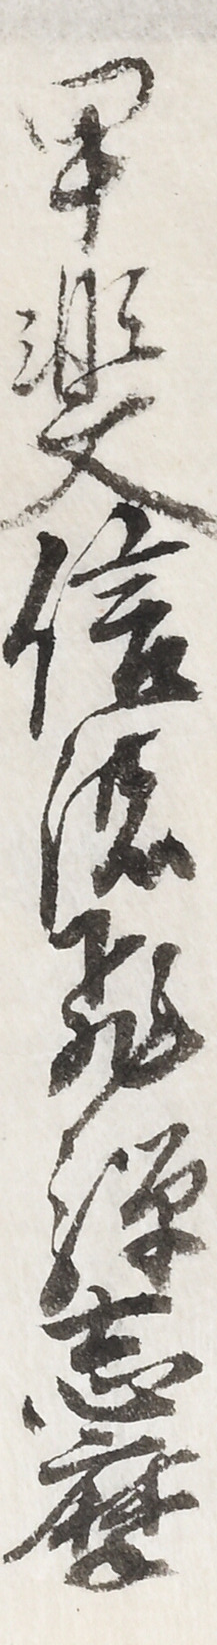甲斐信濃飛騨志摩
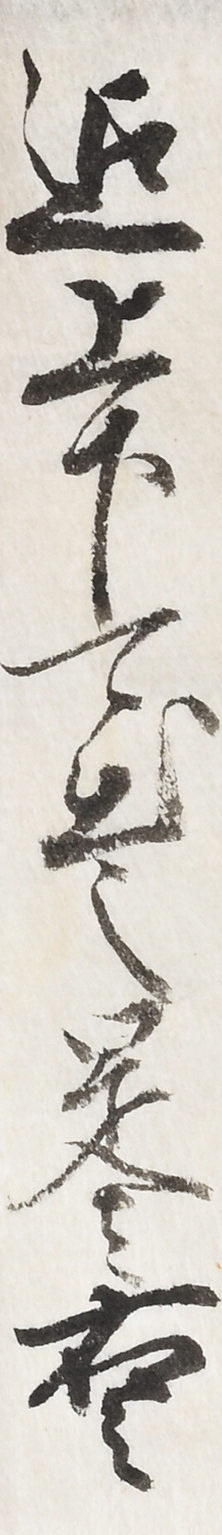迄上下可出之是者右之
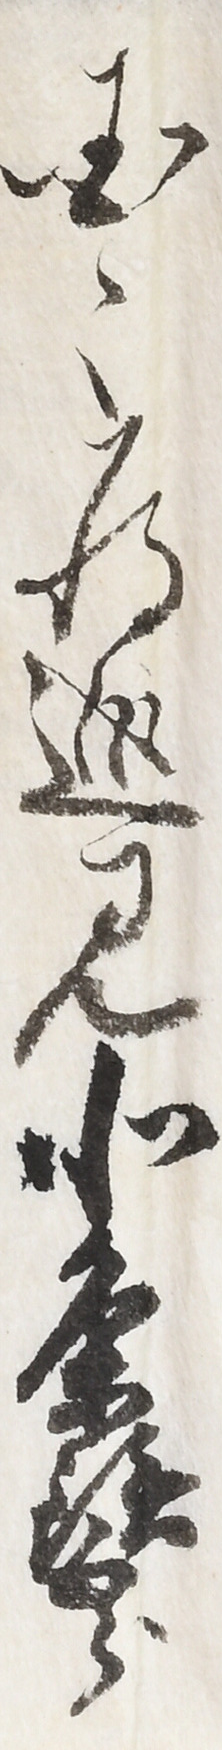国々為巡見北条鉄五郎
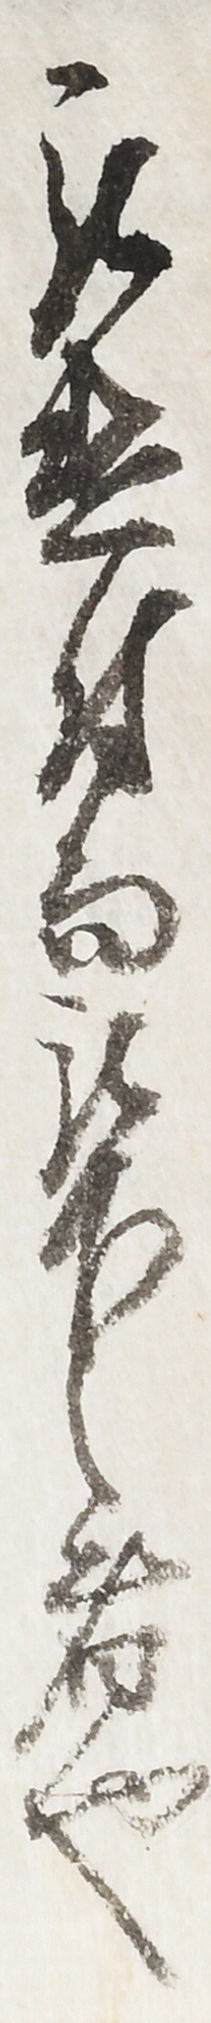被遣付而被下候者也
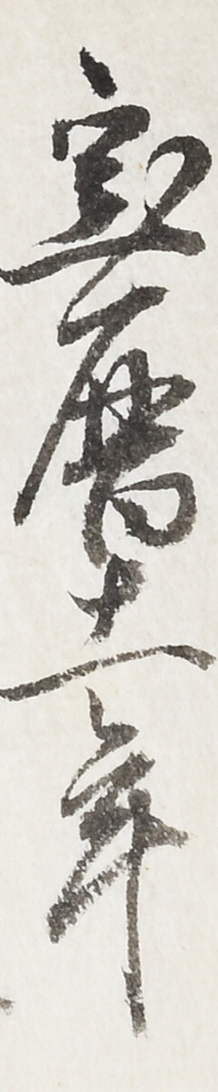宝暦十一年
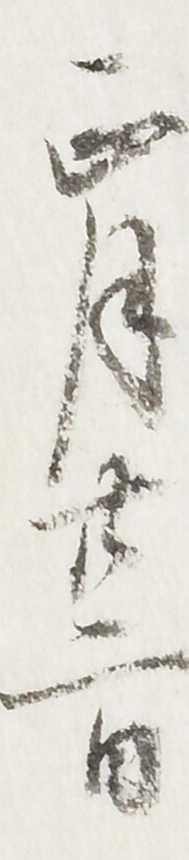正月廿二日
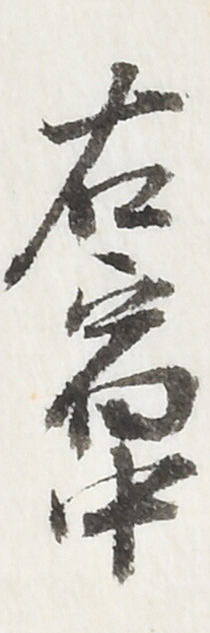右宿中
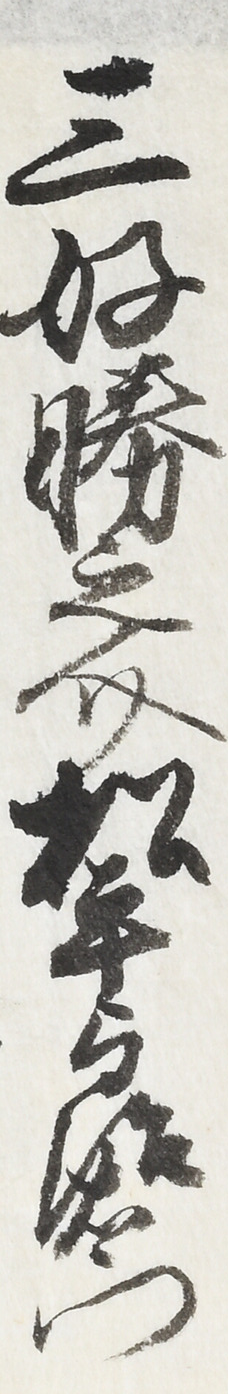三好勝之介松平与治右衛門
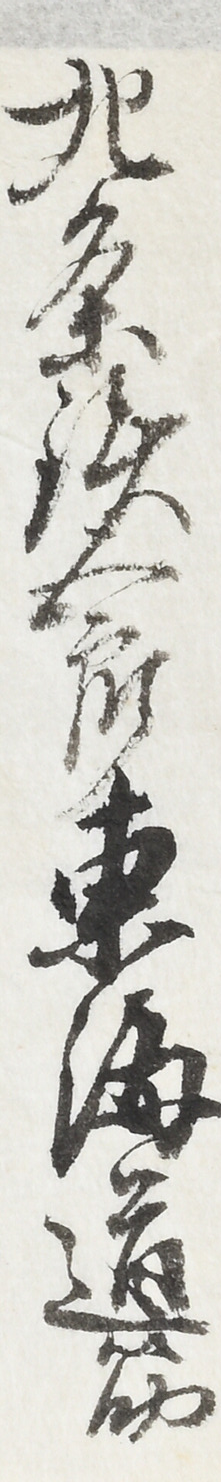北条鉄五郎東海道筋
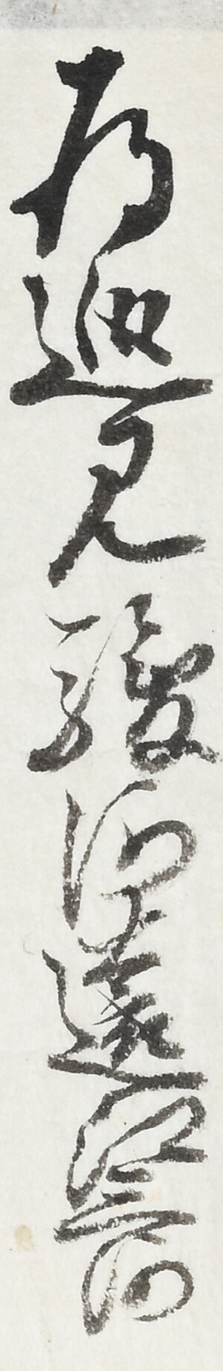為巡見駿河遠江三河
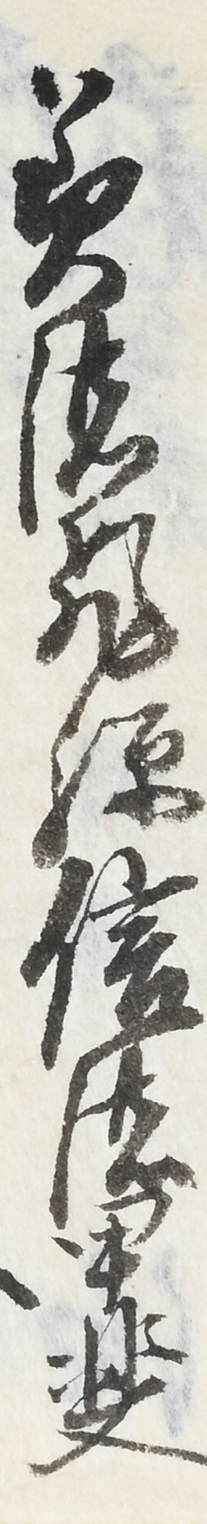美濃飛騨信濃甲斐
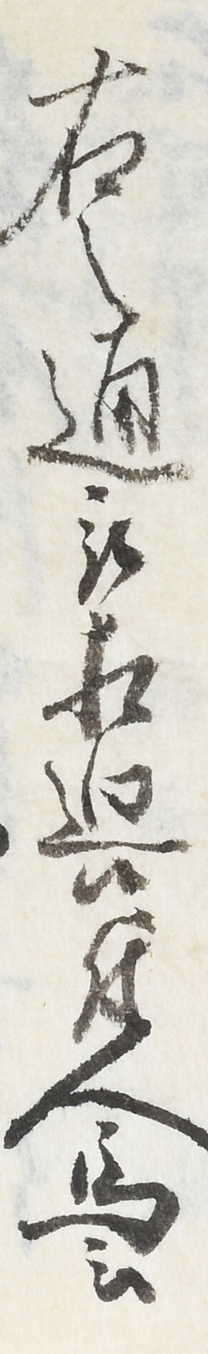右之通被相廻候ニ付人馬被
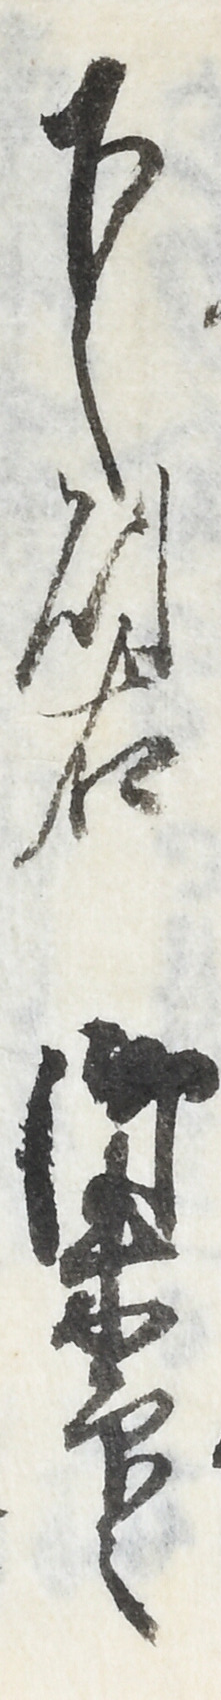下候則右御朱印之
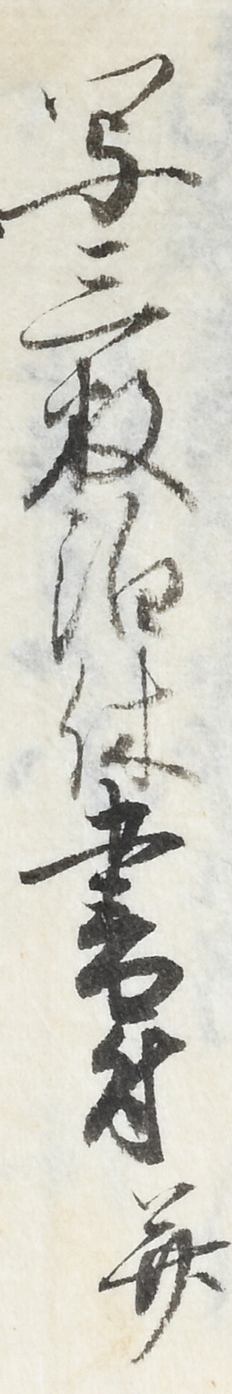写三枚泊休書付并

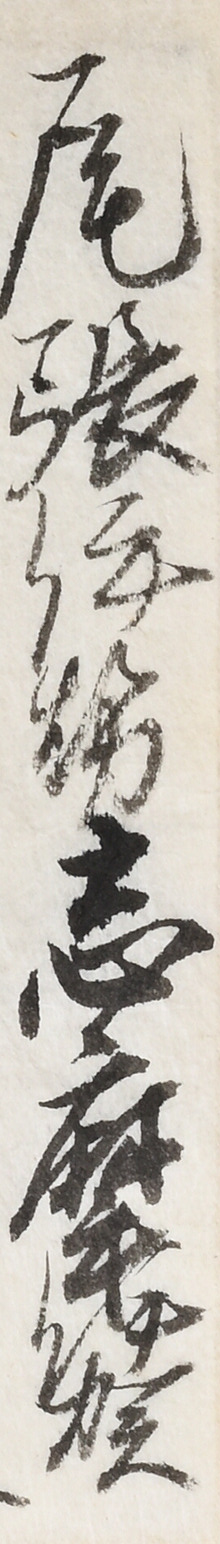尾張伊勢志摩伊賀
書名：御巡見様御先觸之写
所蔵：伊那市立高遠町図書館・合同会社AMANE
